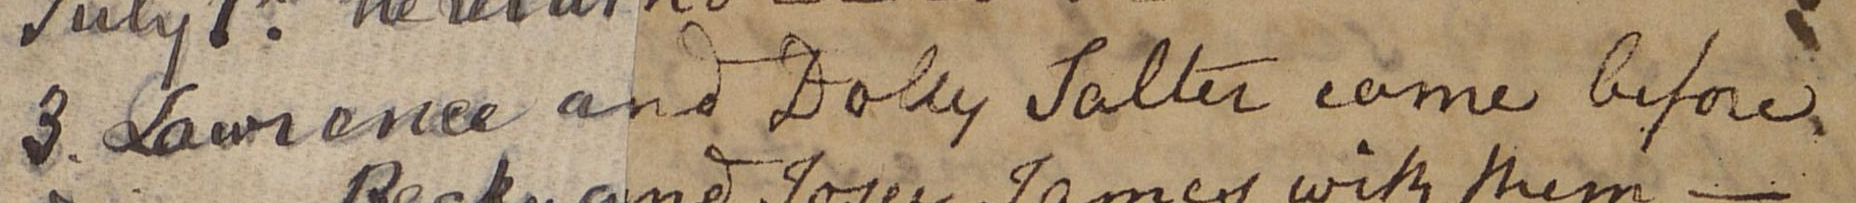3. Lawrence and Dolly Salter came before
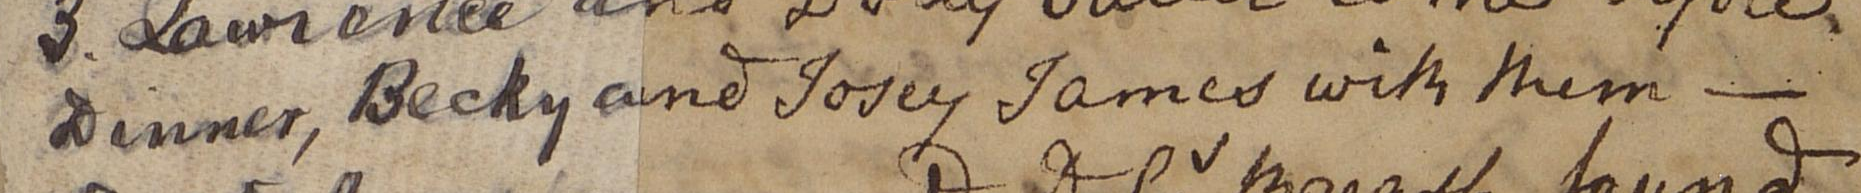Dinner, Becky and Josey James with them-
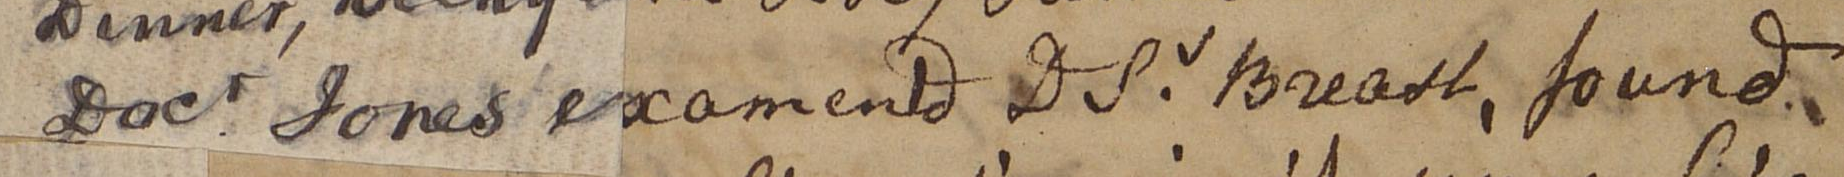Doc^r Jones examen'd DS^s. Breast, found.
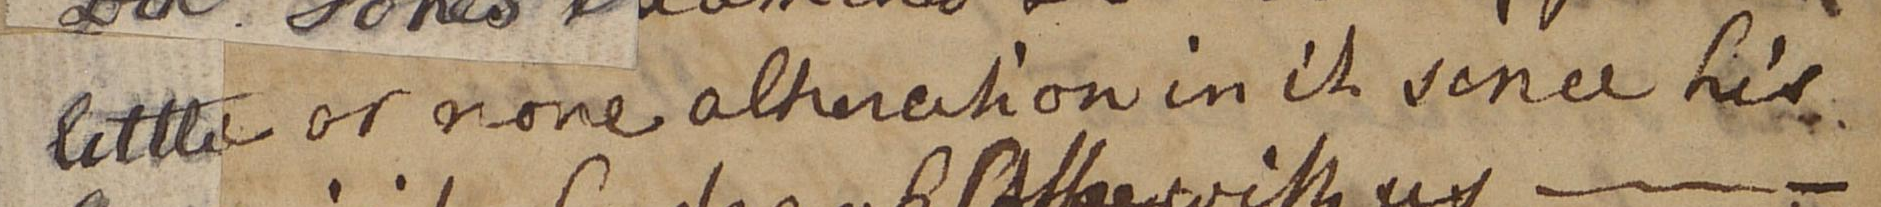little or none alteration in it since his
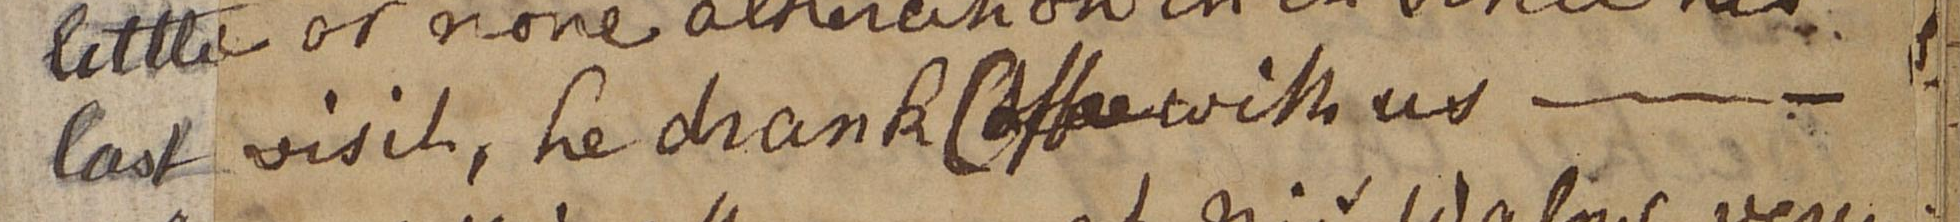last visit, he drank Coffee with us-
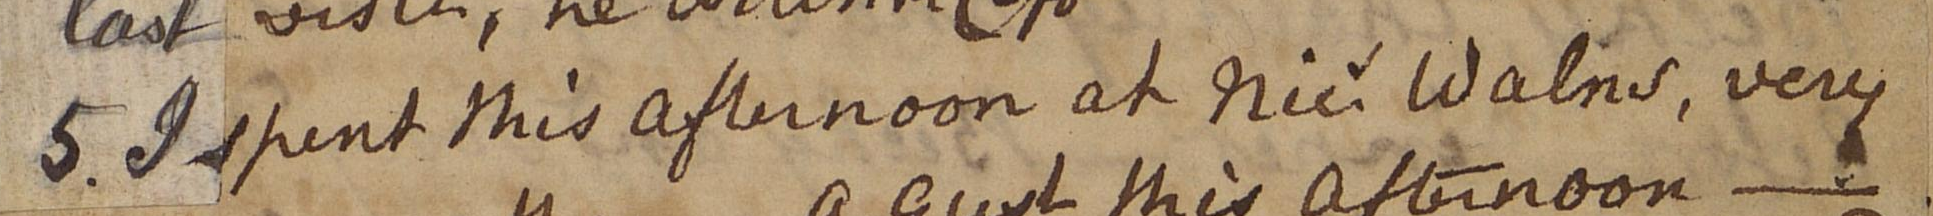5. I spent this afternoon at Nic.^s Walns, very
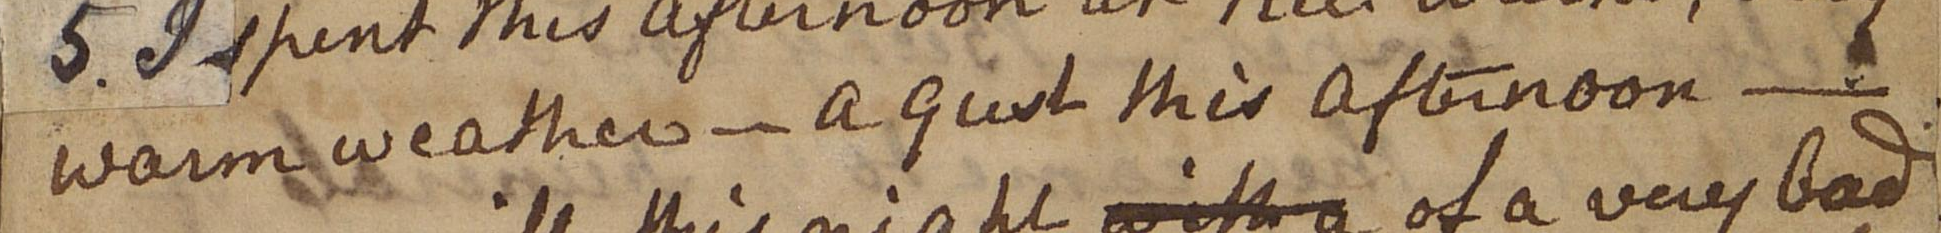warm weather- A Gust this afternoon-
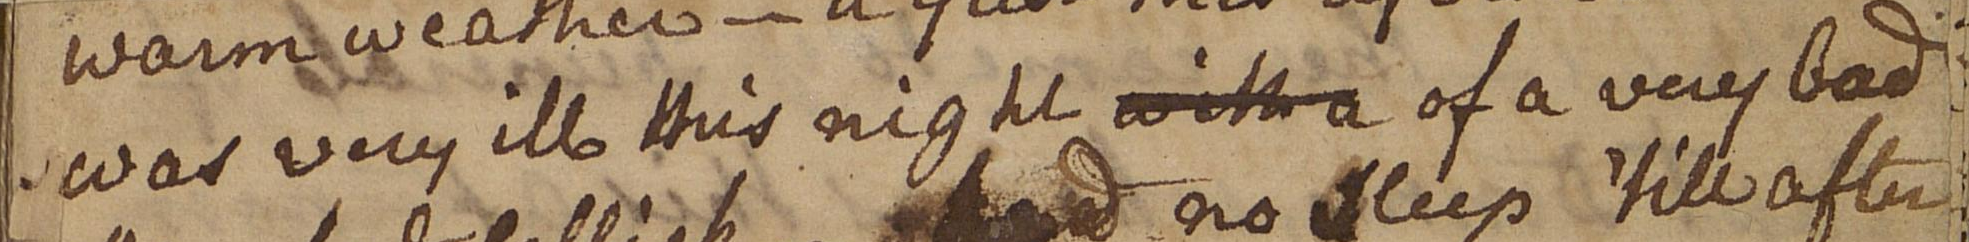was very ill this night with a of a very bad
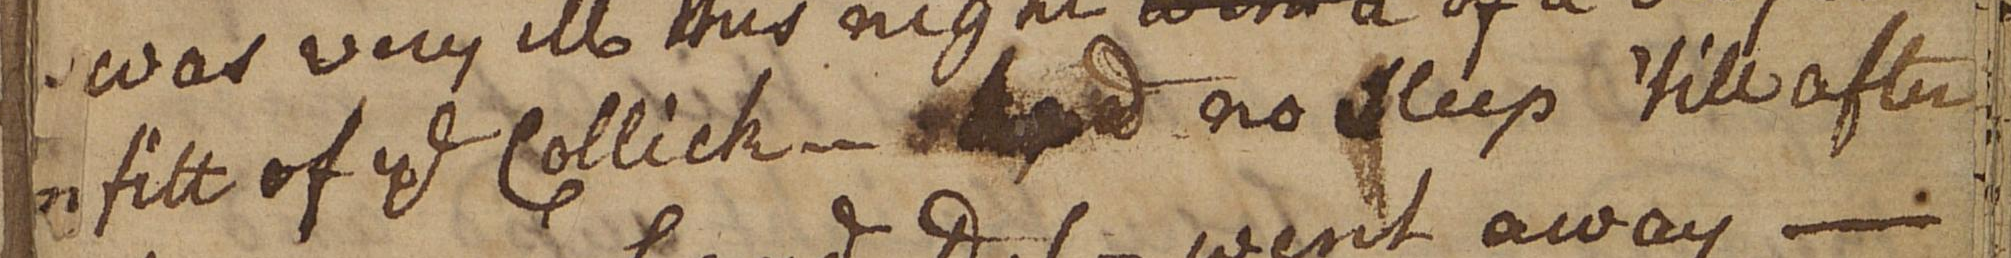[n] fitt of y^e Collick- [stopd] no Sleep till after
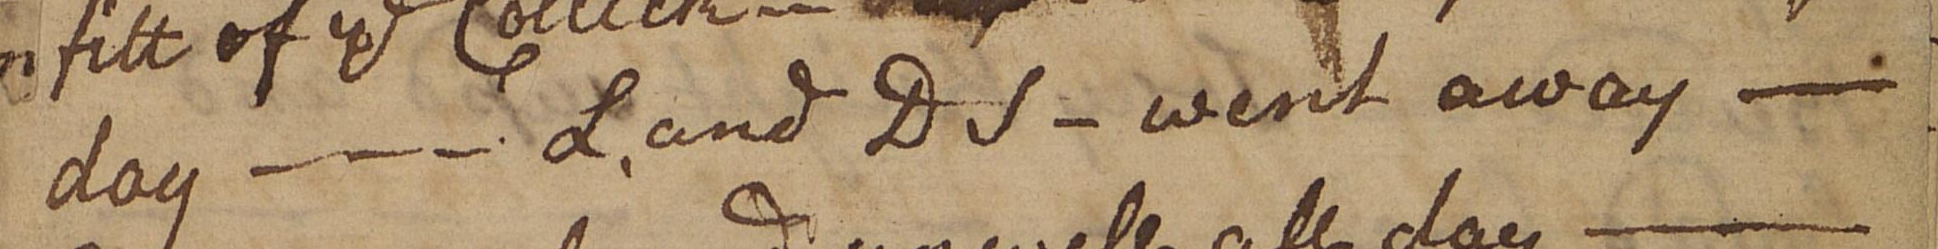day-- L and DS- went away-
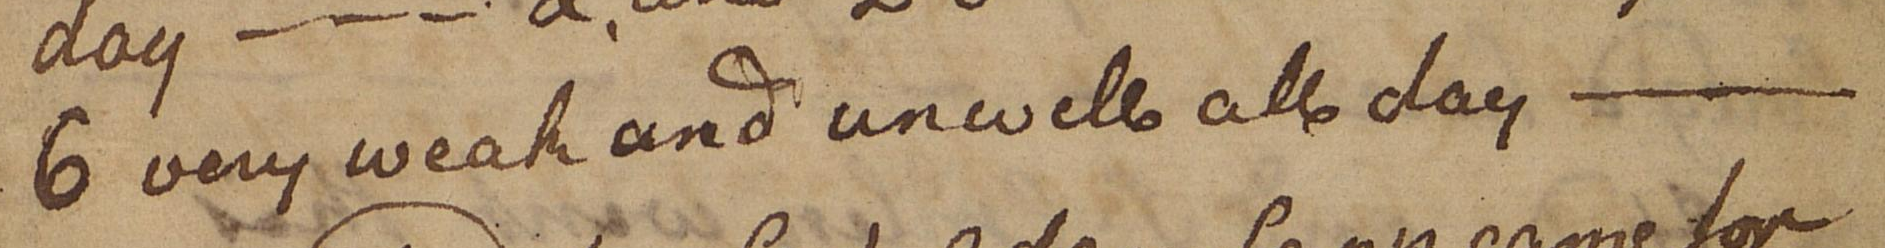6 very weak and unwell all day-
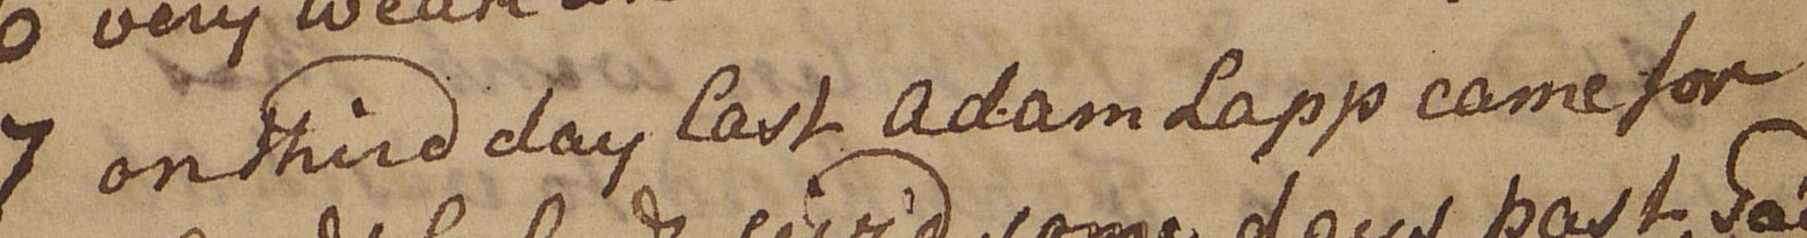7 on third day Last Adam Lapp came for
